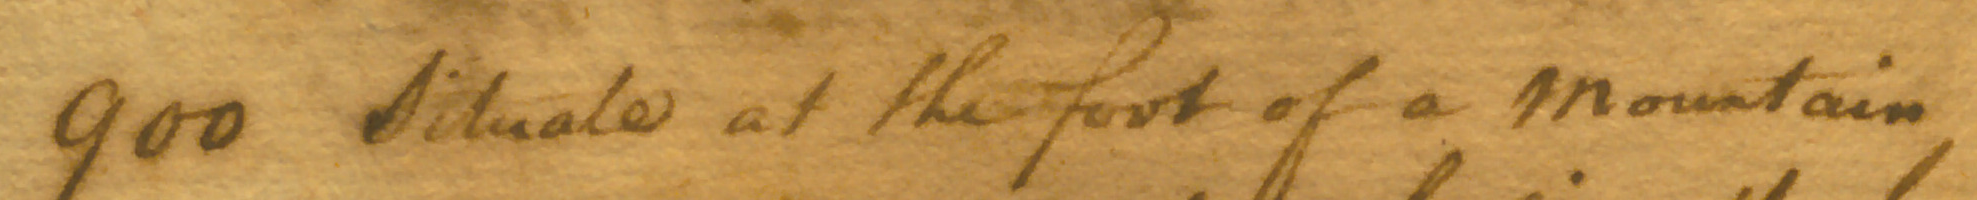900 Situate at the foot of a mountain
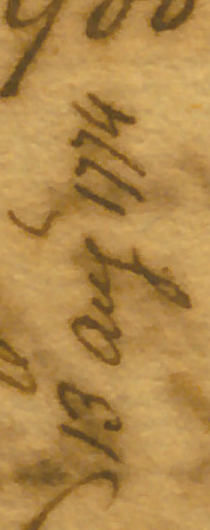13^th Aug^t 1774
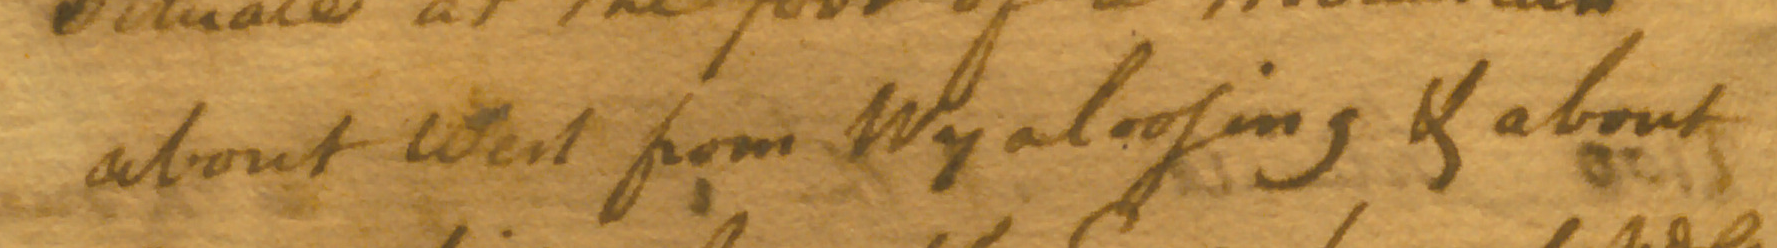about west from Wyaloosing & about
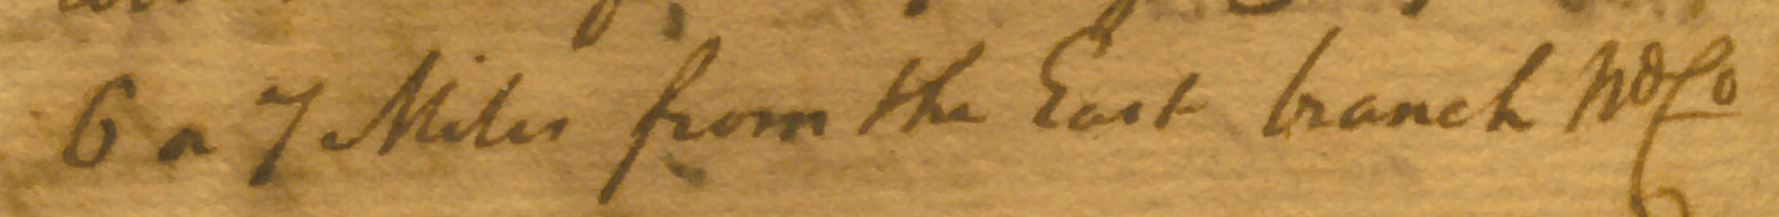6 or 7 Miles from the East branch N^o C^o-
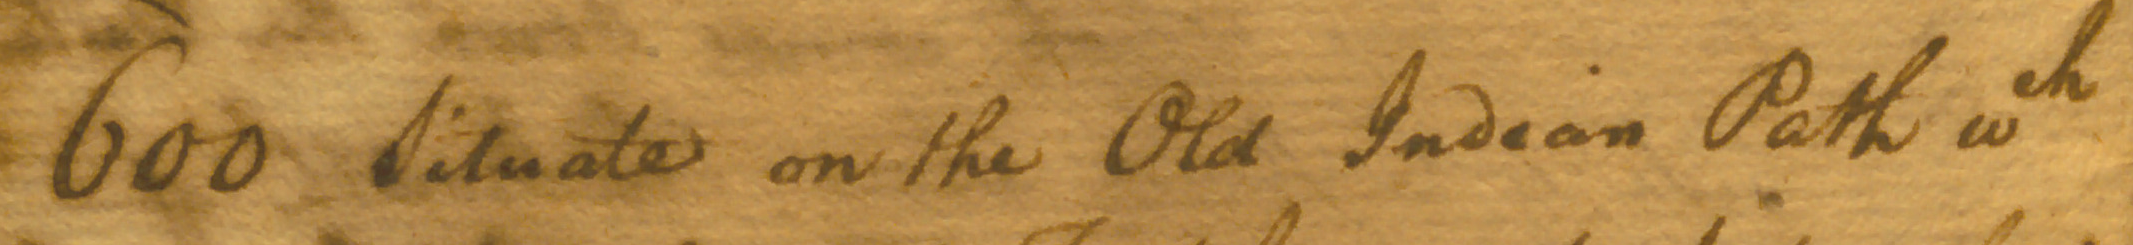600 Situate on the Old Indian Path w^ch
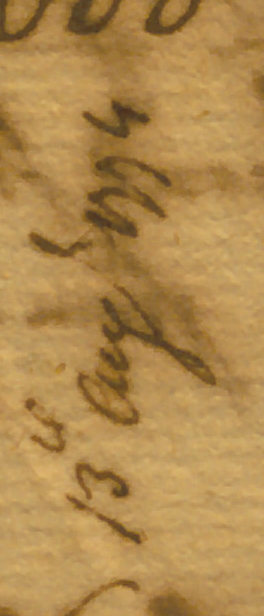13^th Aug^t 1774
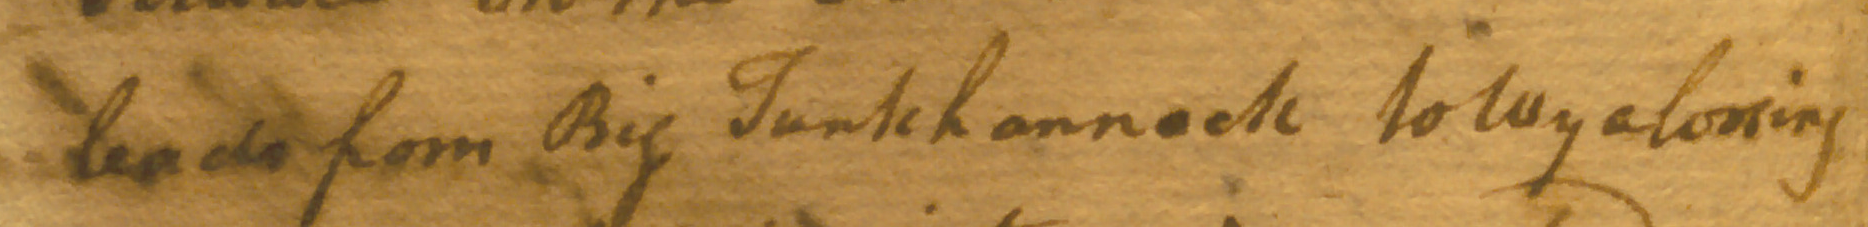leads from Big Tunkhannock to Wyaloosing
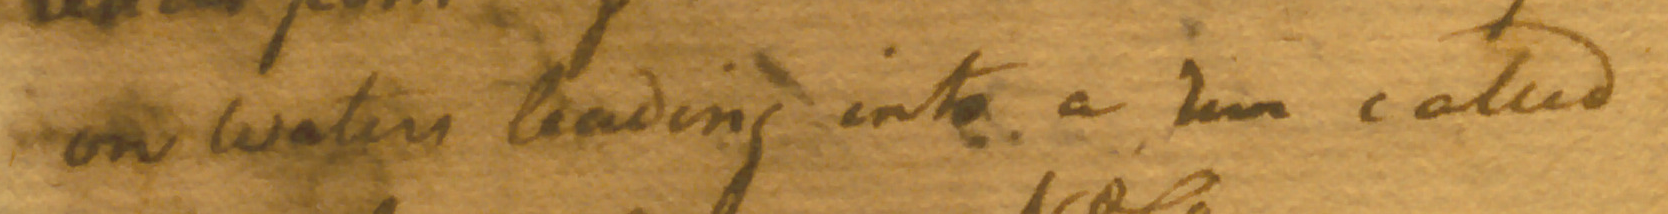on Waters leading into a run called
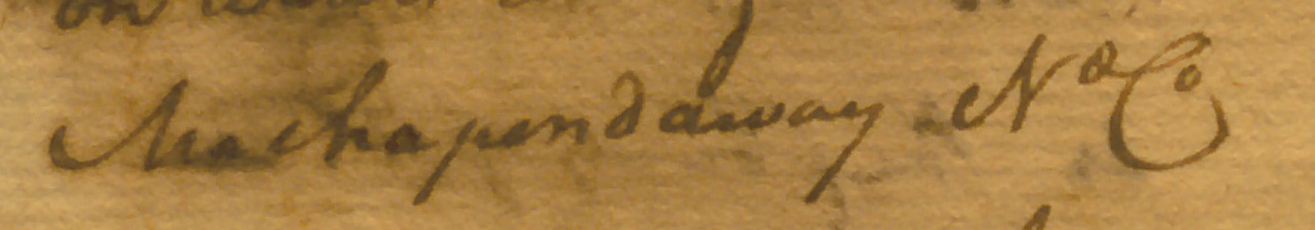Machapendaway N^o C^o
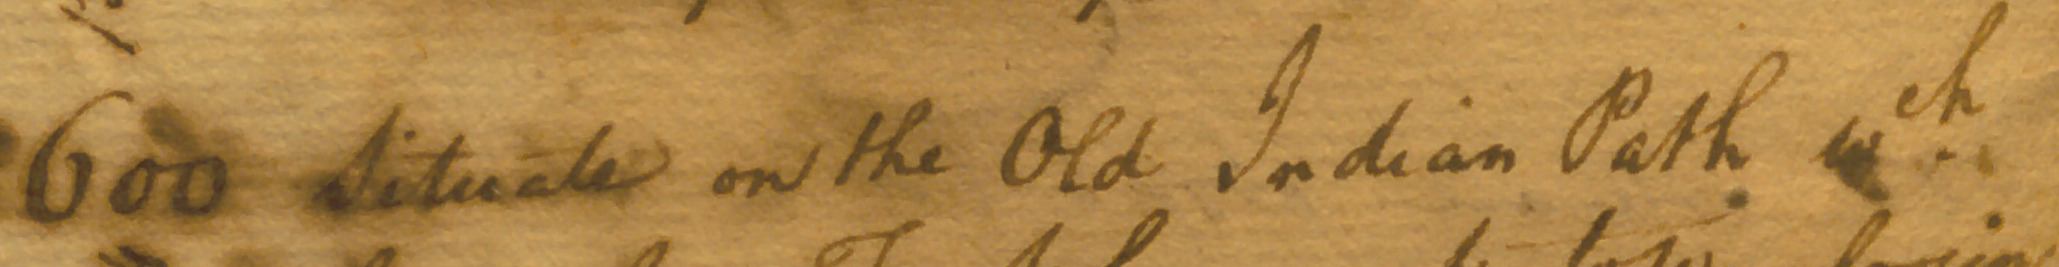600 Situate on the Old Indian Path w^ch.
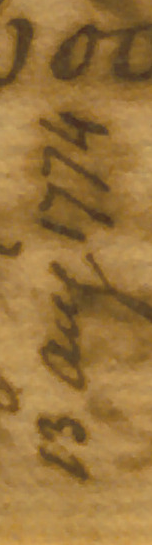13^th Aug^t 1774
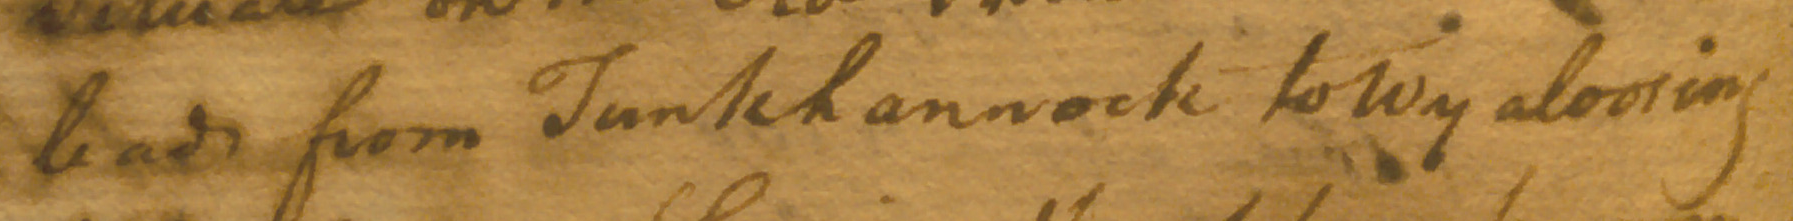leads from Tunkhannock to Wyaloosing
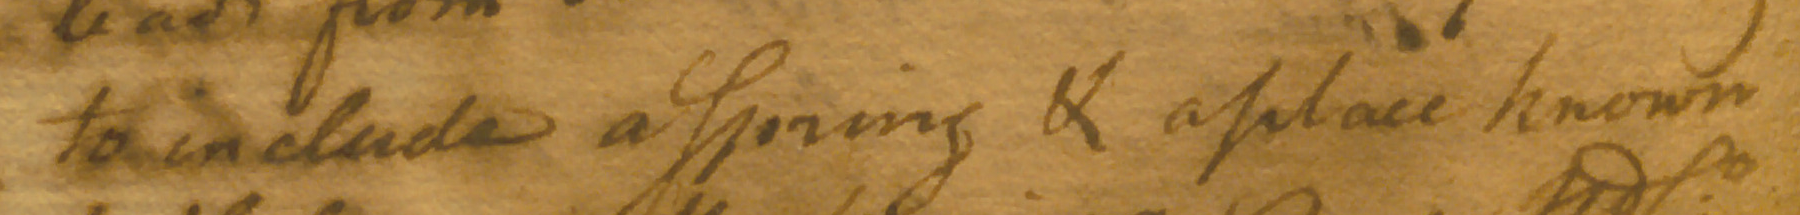to include a spring & a place known
